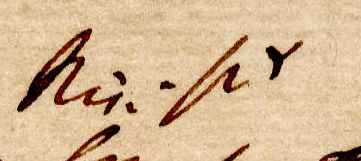his. py
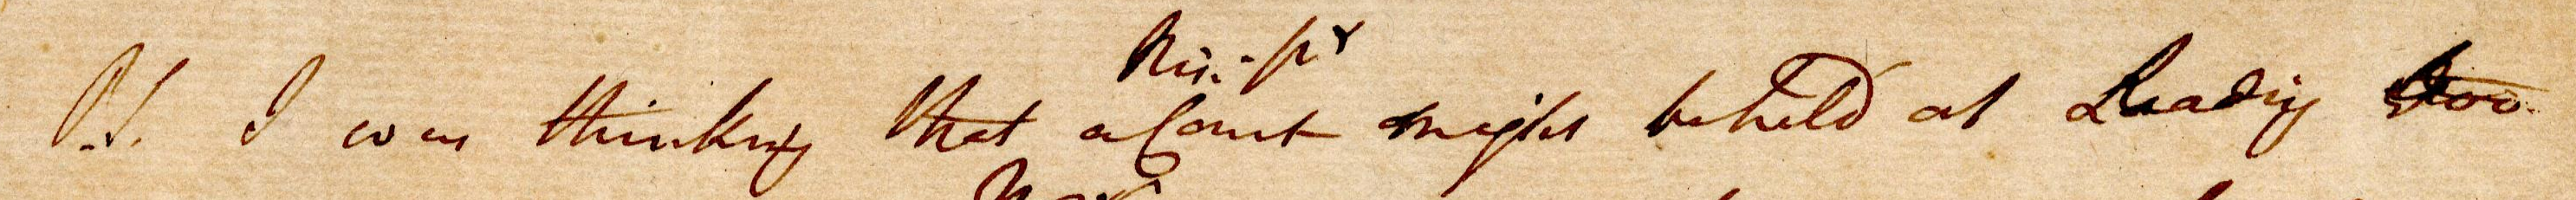PS. I was thinking that a ^ Count might be held at leading 600
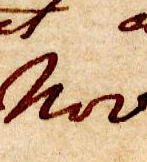Nov
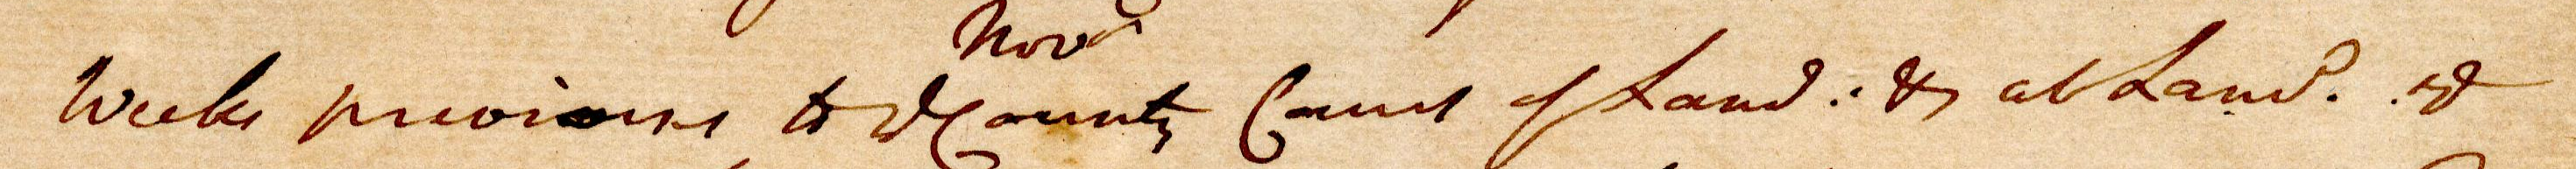Weeks provisions to y^e County Court of Land. & at Law^. y^e
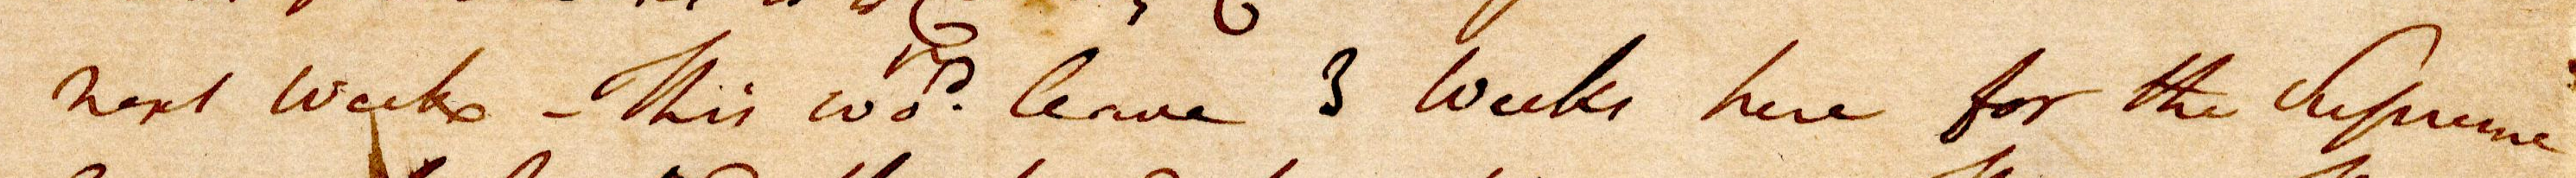next weeks. This wo^d serve 3 Weeks here for the Supreme
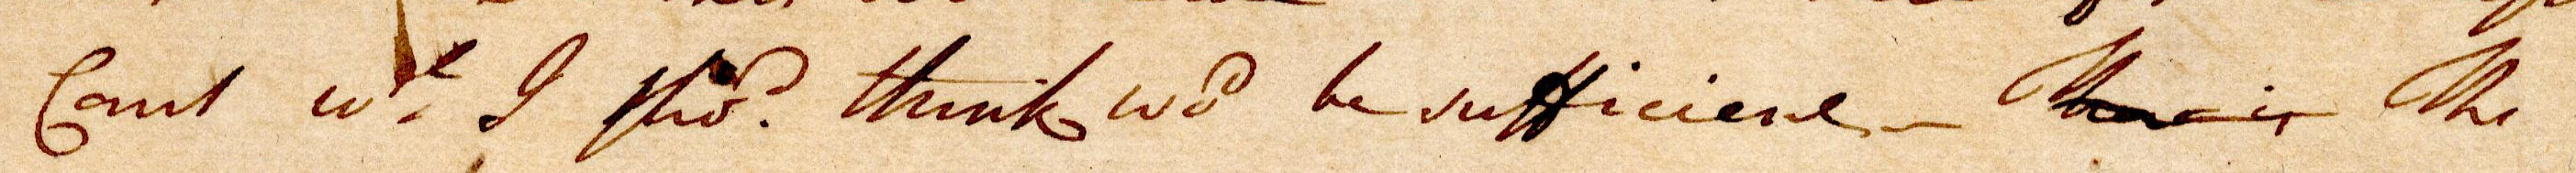Court w^h I sho^d. think w^d be sufficient There is The
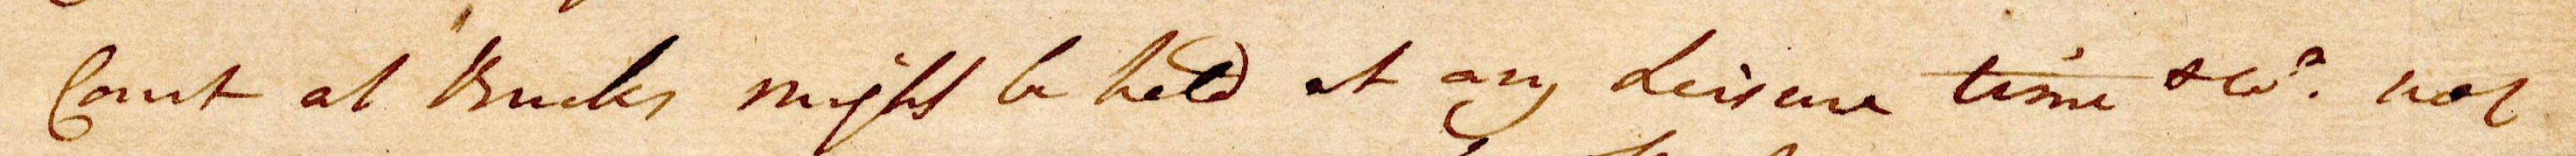Court at Bucks might be held at any Leisure time & w^h not
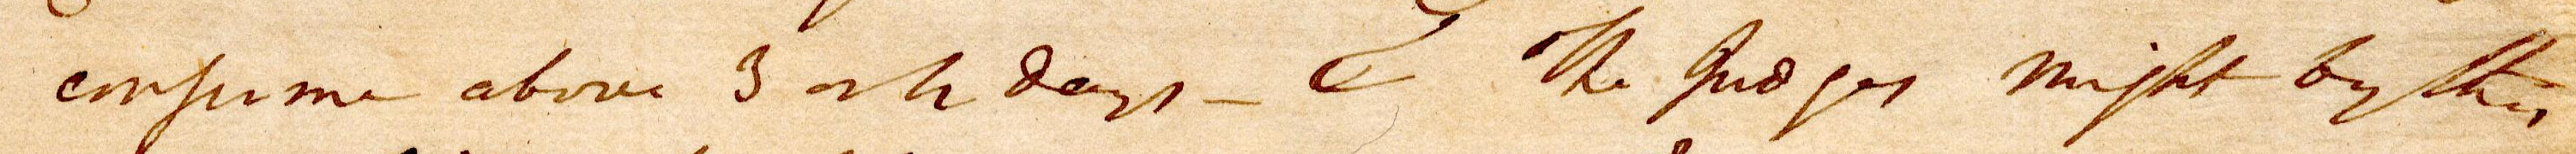confirm above 3 or 4 days. The Judges might by their
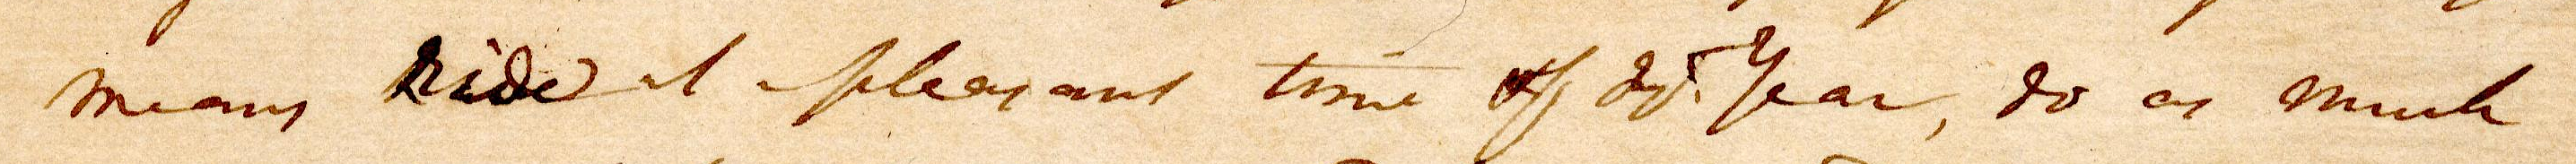Means Ride it-pleasant time of y^e Year, so as much
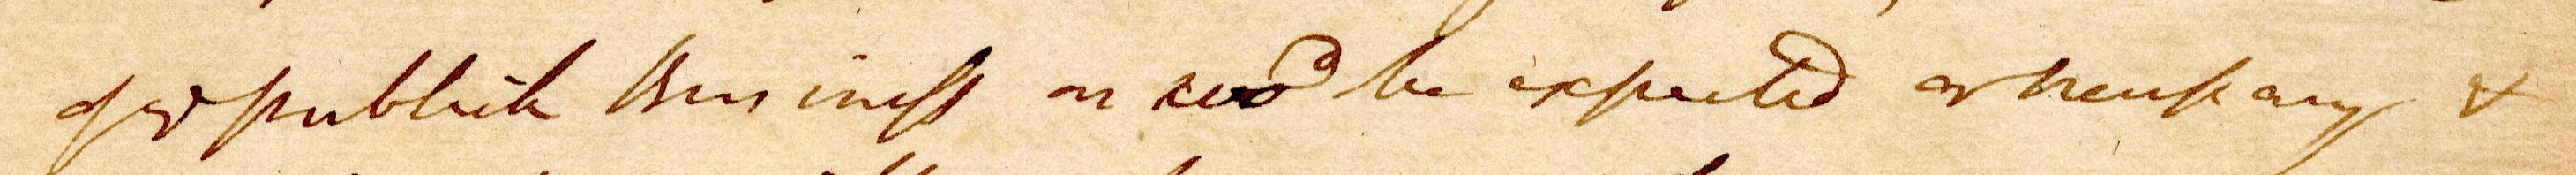of y^e publick Business as rec^d be expected as necessary &
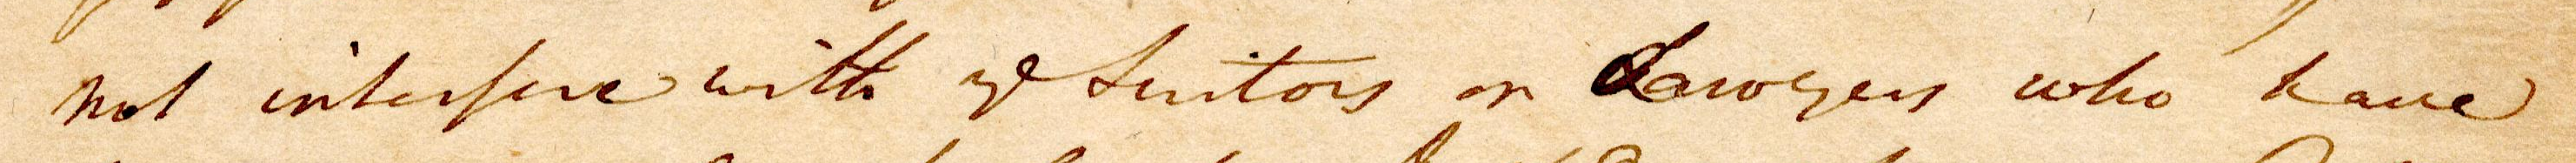not interfere with y^e Suitors of Lawyers who have
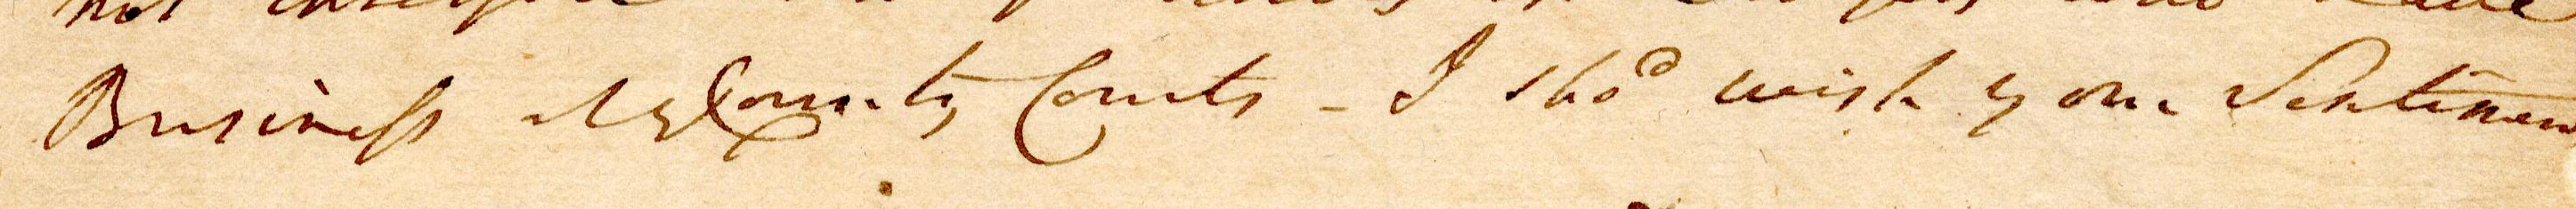Business at y^e County Courts. I sho^d wish your Sentiments
